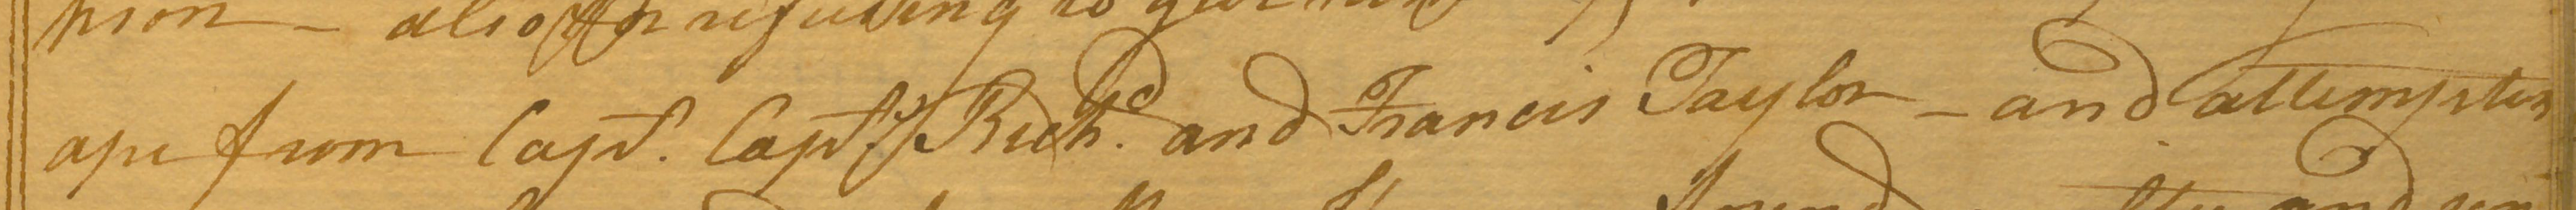ape from Cap^t. Cap^t. Rich^d. and Francis Taylor- and attemptin
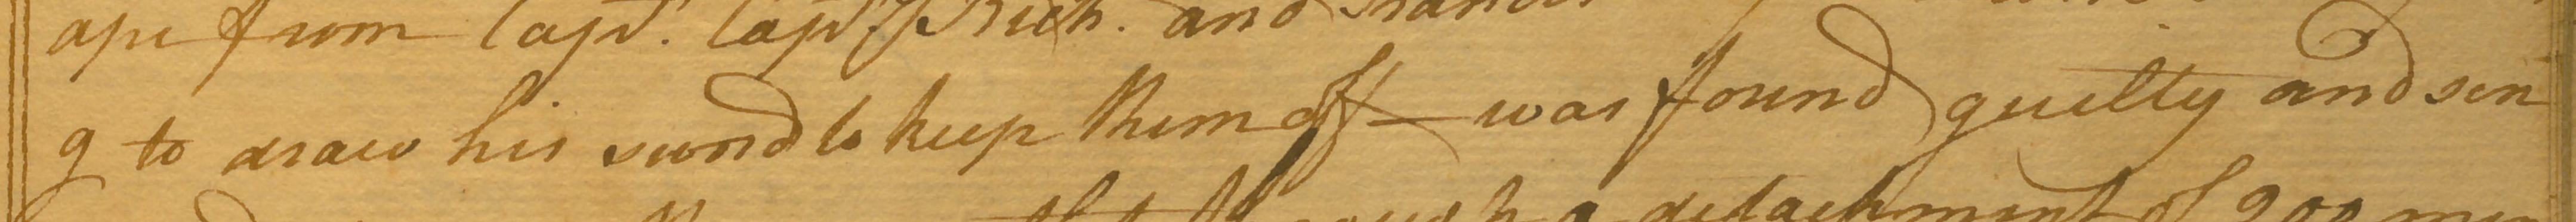g to draw his sword to keep them off- was found guilty and sen
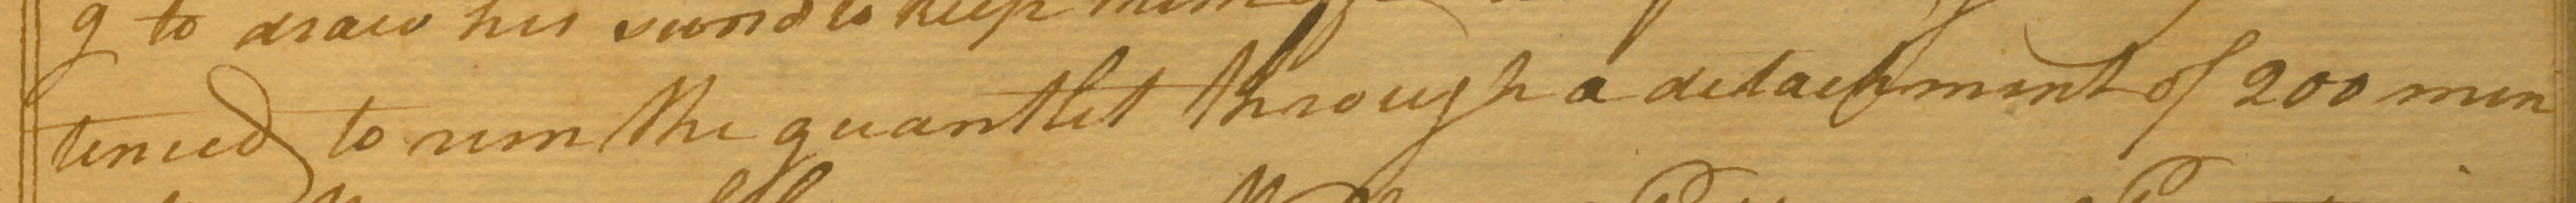tenced to run the guantlet through a detachment of 200 men
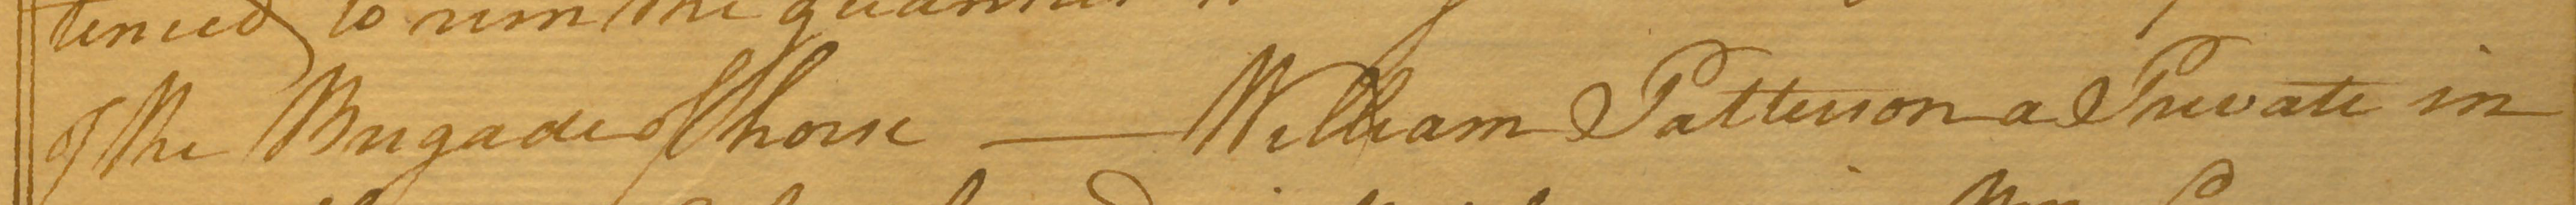of the Brigade of horse- William Patterson a Private in
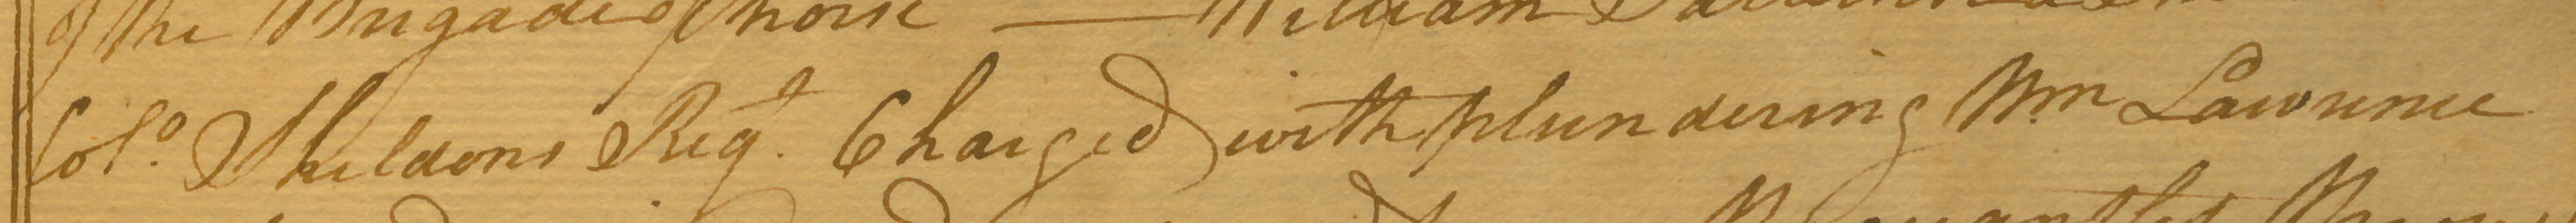Col^o. Sheldons Reg^t. charged with plundering W^m. Lawrence
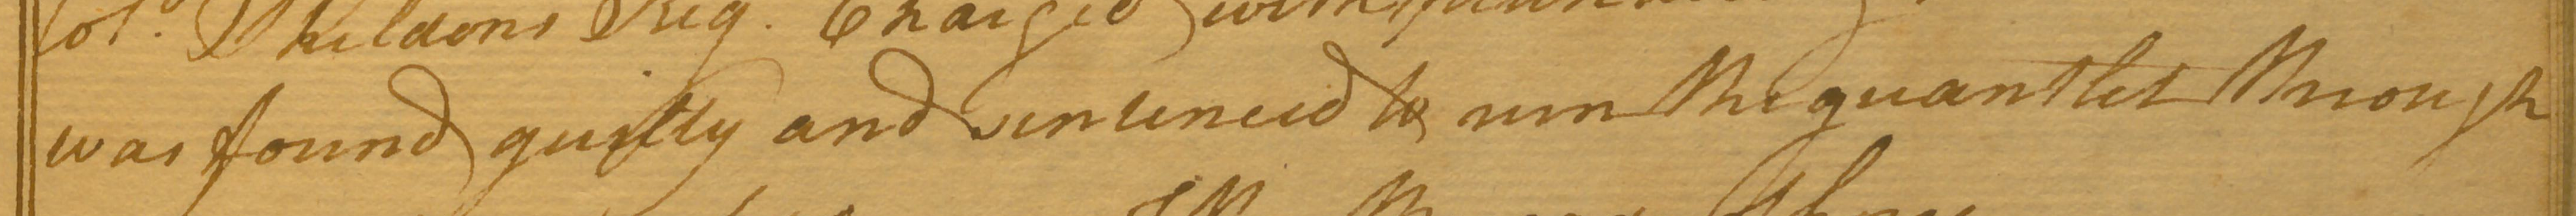was found guilty and sentenced to run the guantlet through
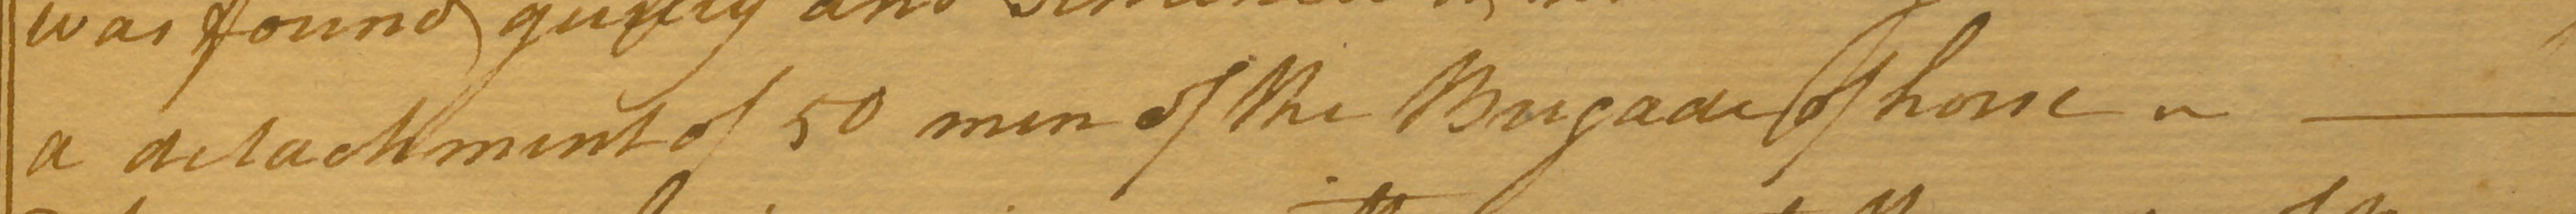a detachment of 50 men of the Brigade of horse- -
